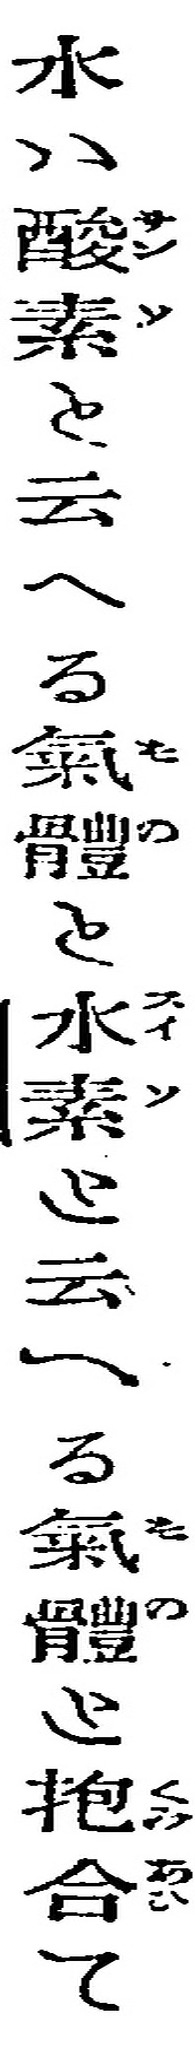水は酸素と云へる気体と水素と云へる気体と抱合て
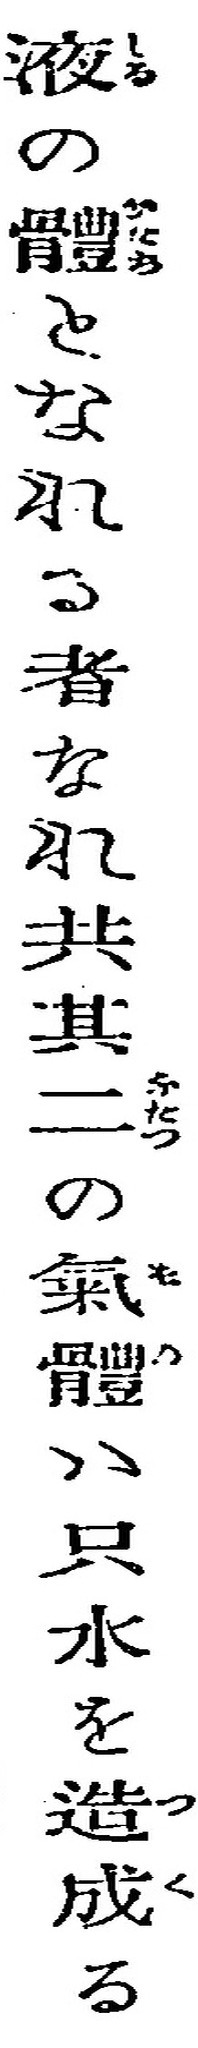液の體となれる者なれ共其二の気体は只水を造成る
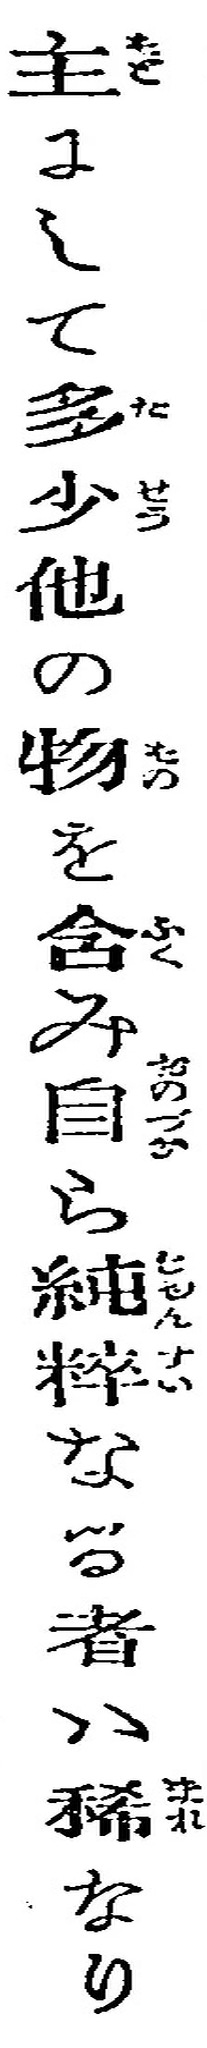主にして多少他の物を含み自ら純粋なる者は稀なり
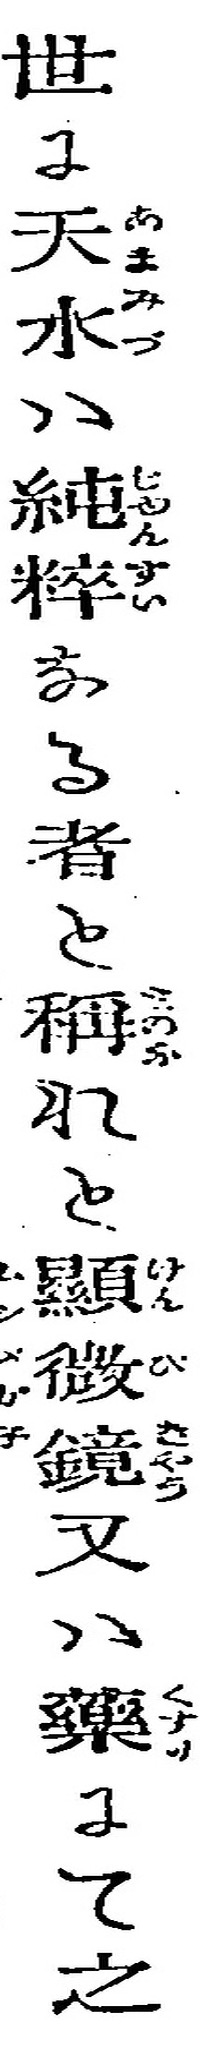世に天水は純粋なる者と稱れと顕微鏡又は藥にて之
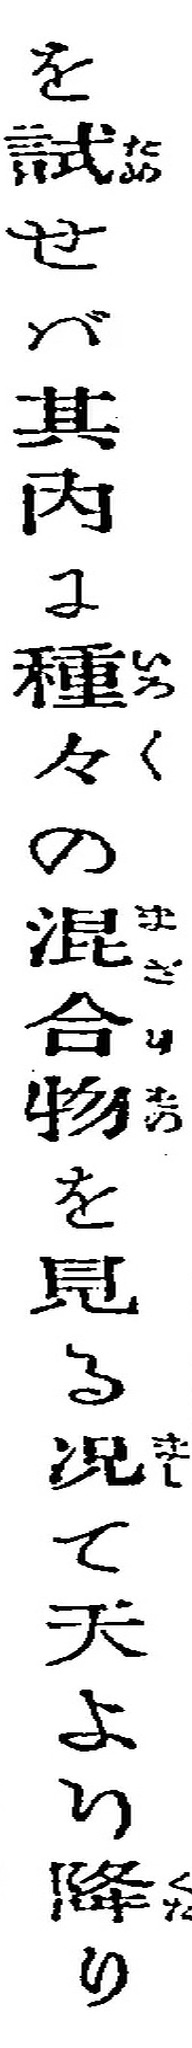を試せば其内に種々の混合物を見る況て天より降り
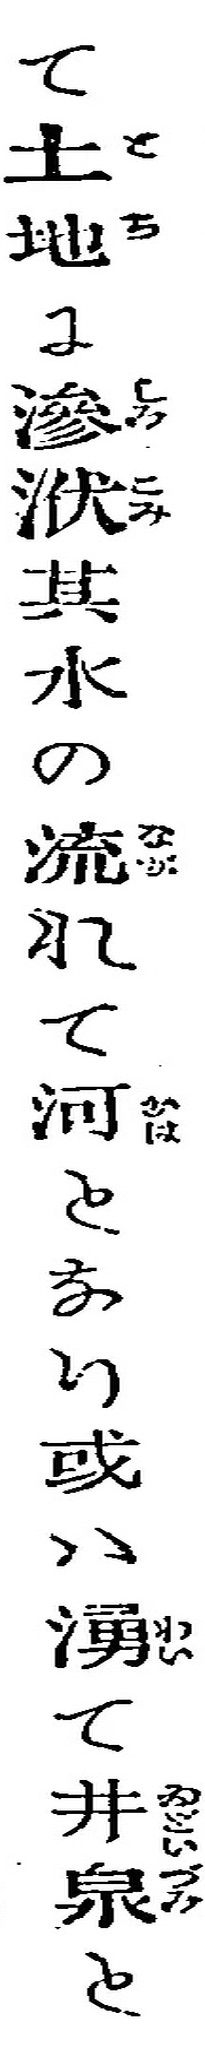て土地に滲洑其水の流れて河となり或は湧て種々
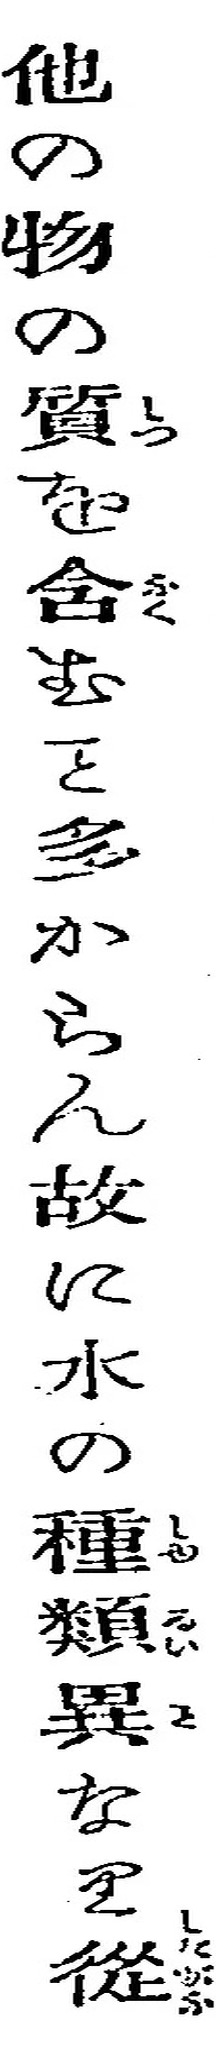他の物の質を含むこと多からん故に水の種類異なり従
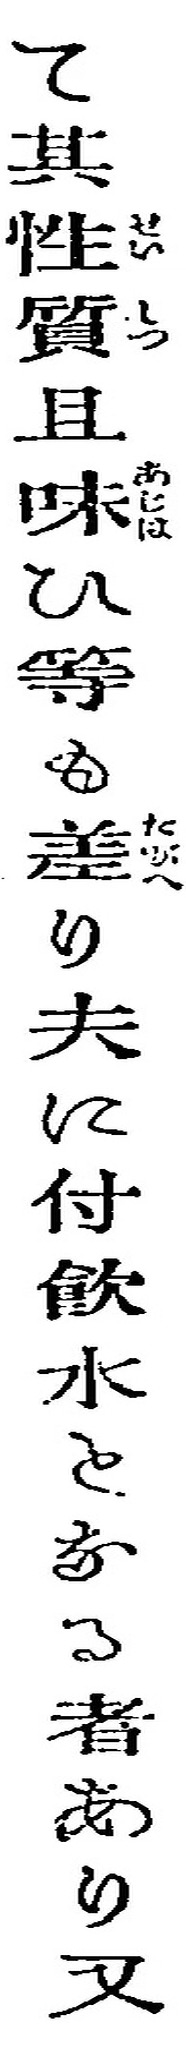て其性質且味ひ等も差り夫に付飲水となる者あり又
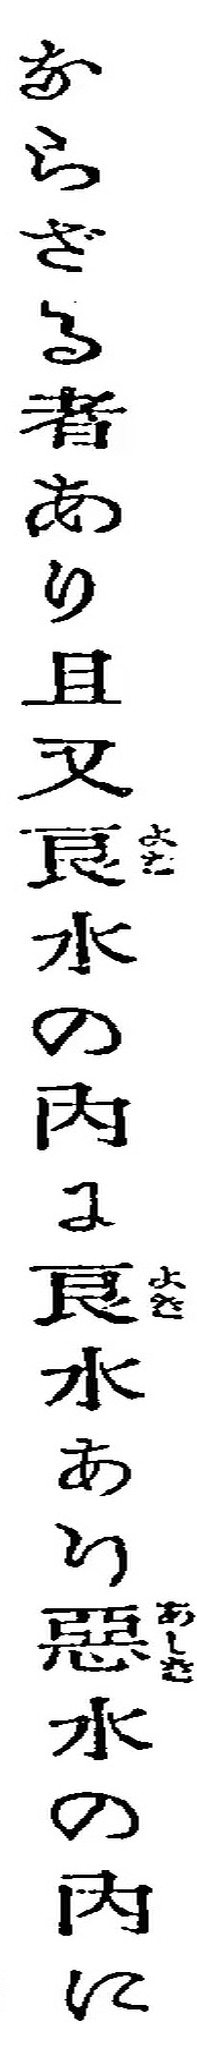ならざる者あり且又良水の内に良水あり悪水の内に
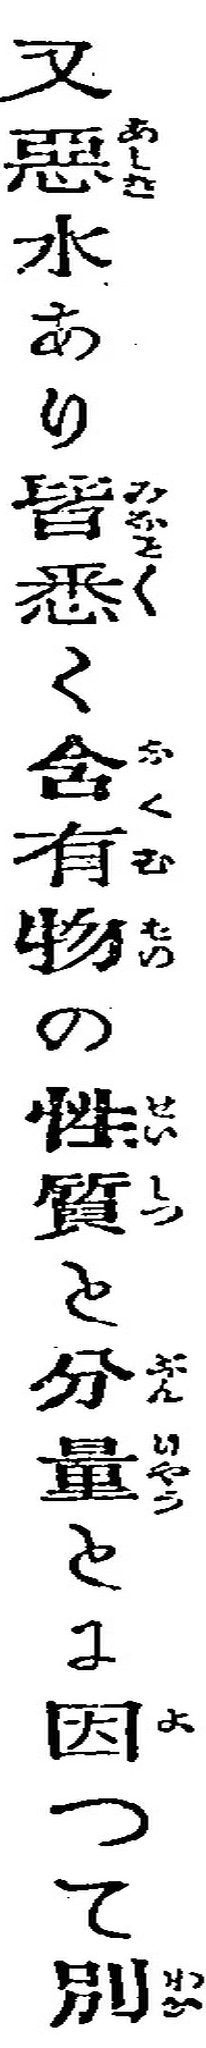又悪水あり皆悉く含有物の性質と分量とに因つて別

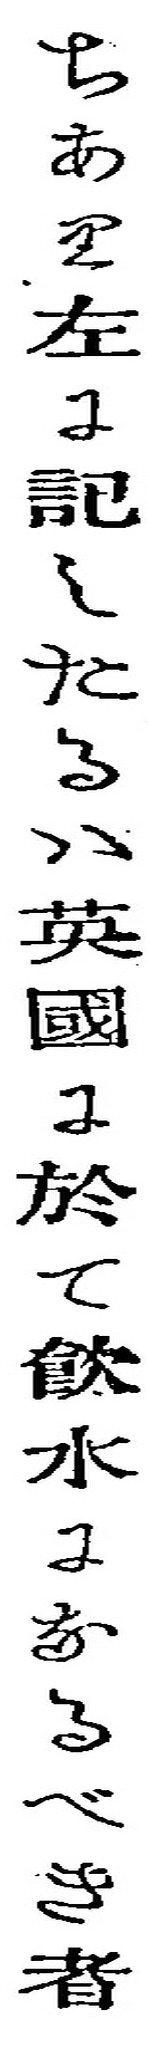ちあり左に記したるは英国に於て飲水になるべき者
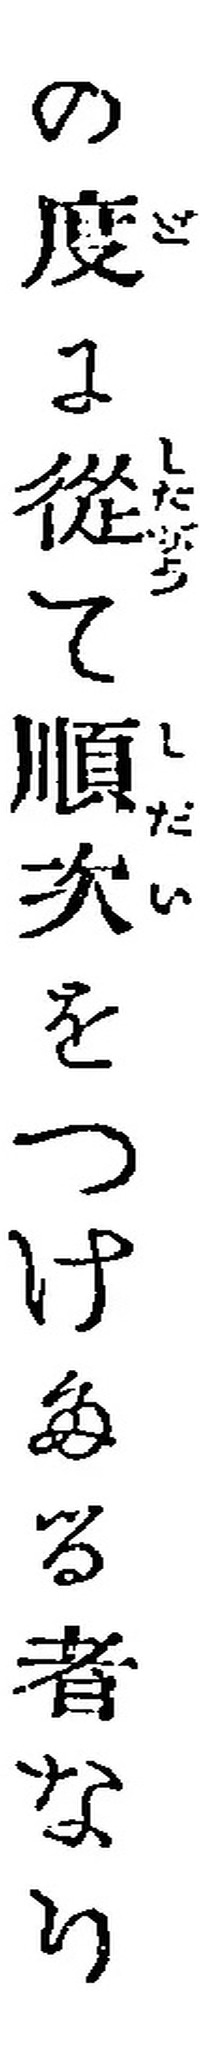の度に従て順次をつけたる者なり
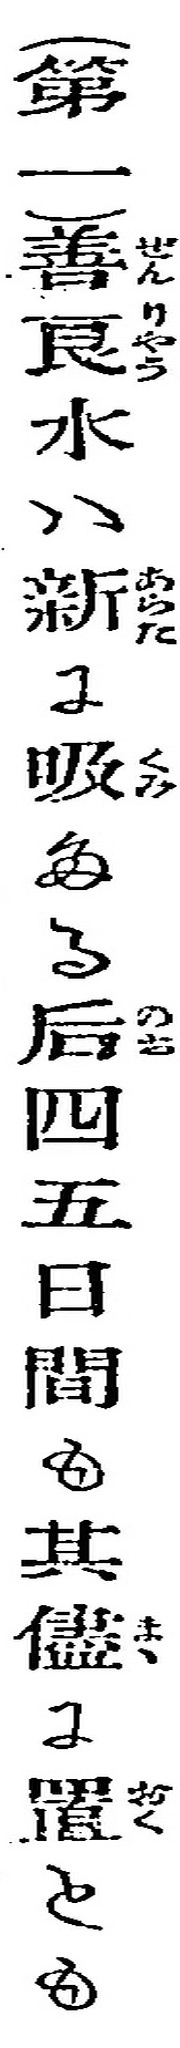[第一]善良水は新に吸たる后四五日間も其儘に置とも
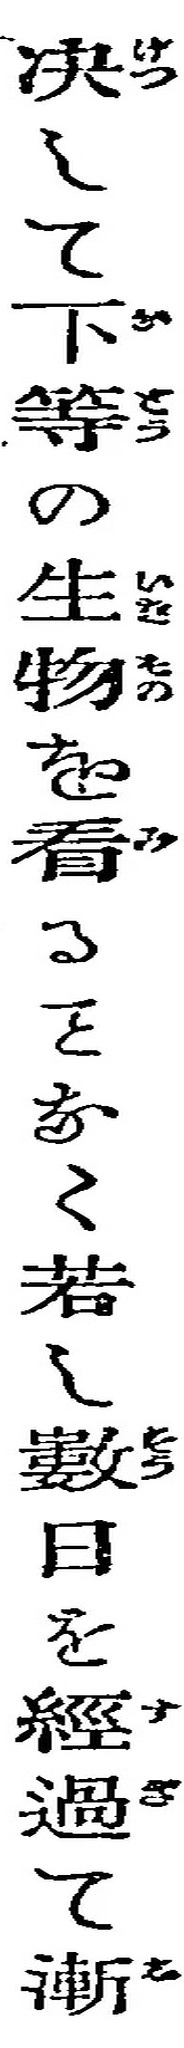決して下等の生物を看ることなく若し数日を経過て漸
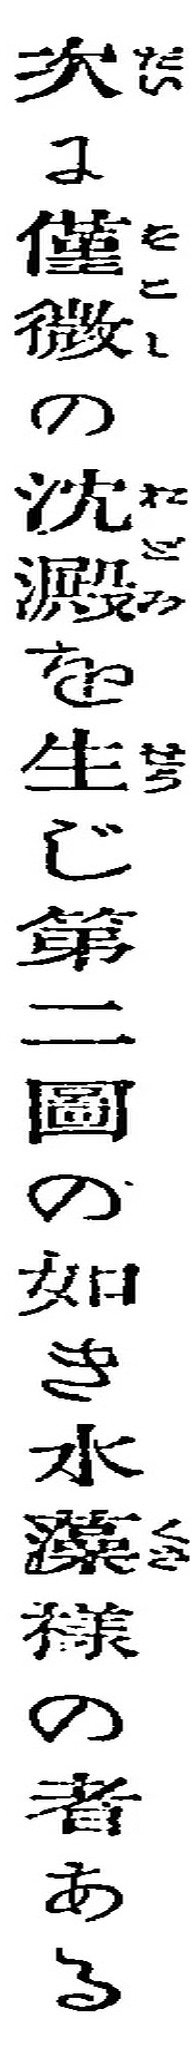次に僅微の沈澱生じ第二圖の如き水藻の者ある
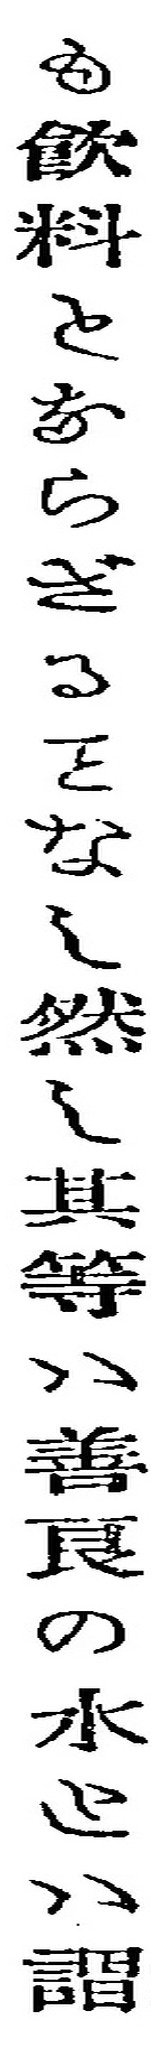も飲料とならざることなし然し其等は善良の水とは謂
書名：飲水の心得 : 伝染病の予防
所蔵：国立国会図書館 National Diet Library, JAPAN
